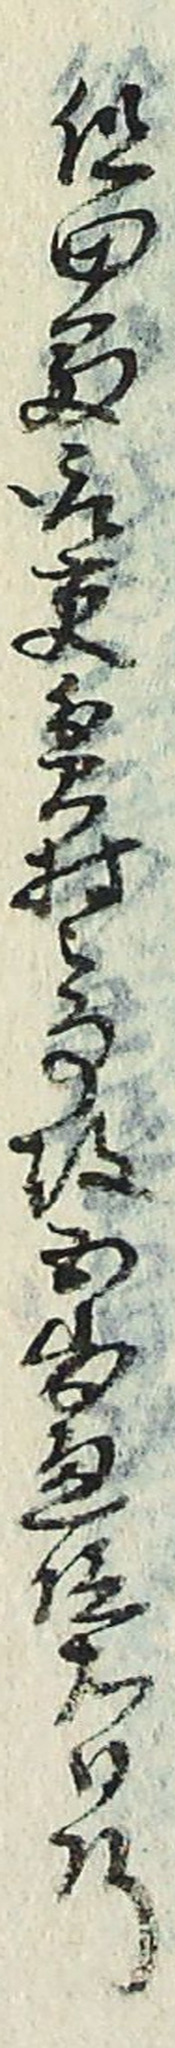但田畠取交貧村之事故五歩通位右同断
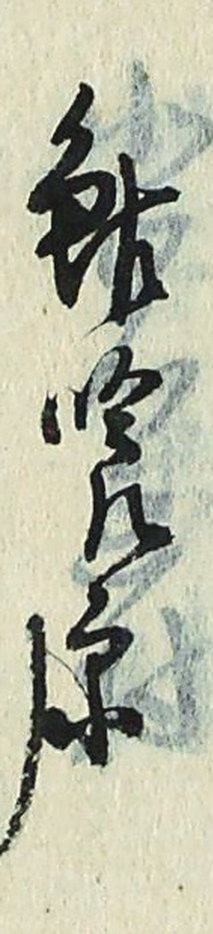鮎喰原
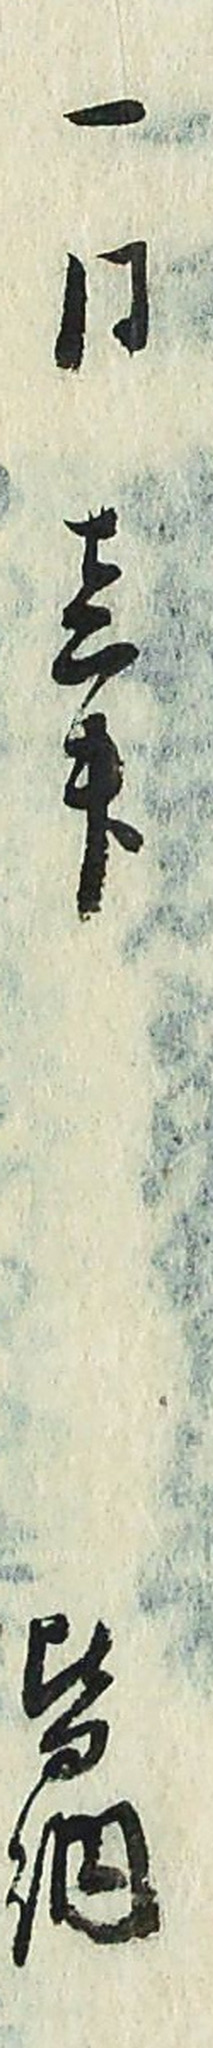一同壱升皆納
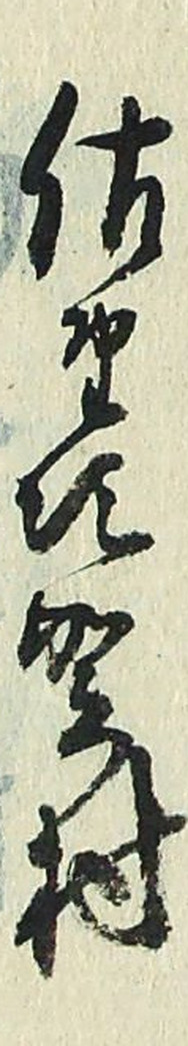佐野須賀村
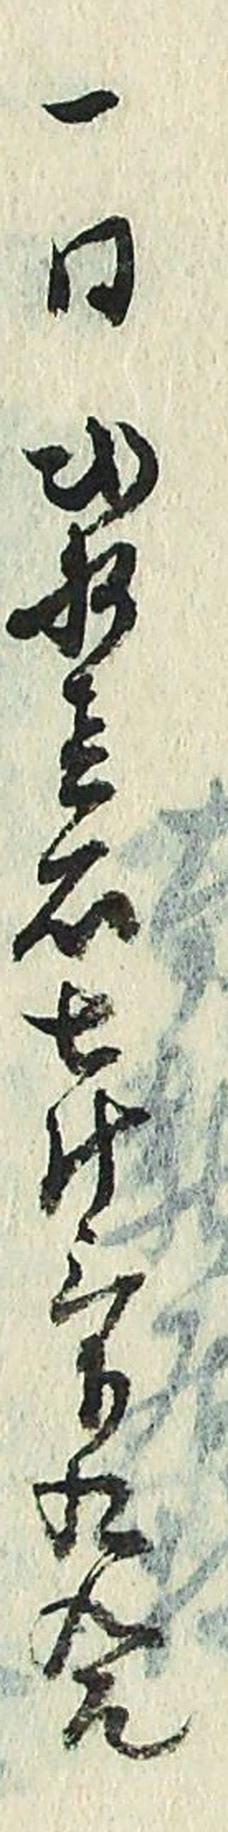一同弐拾壱石七斗三升九合
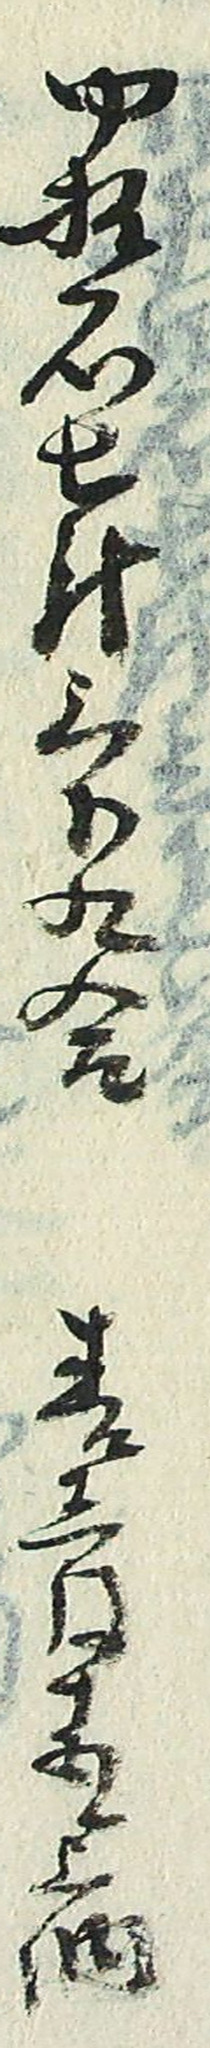内拾石七斗三升九合来ル十二月十五日上納
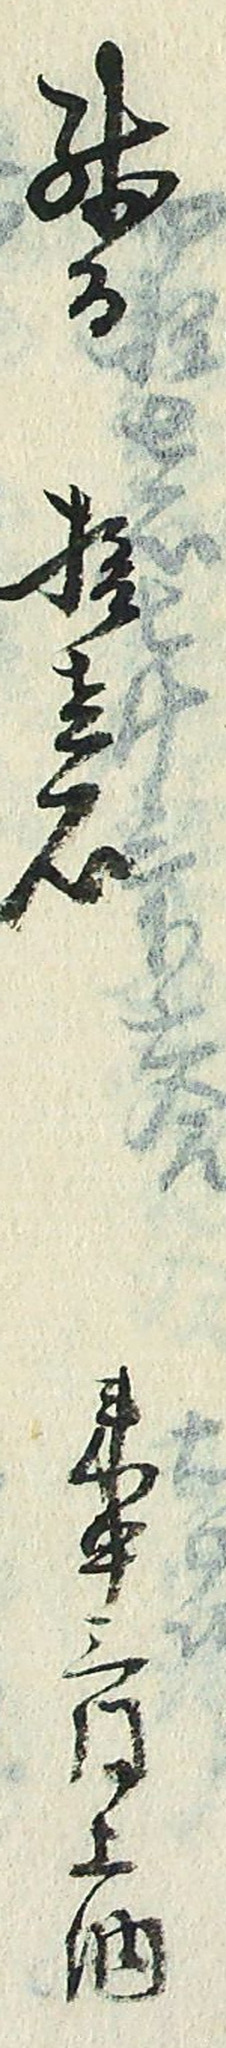残而拾壱石来申三月上納
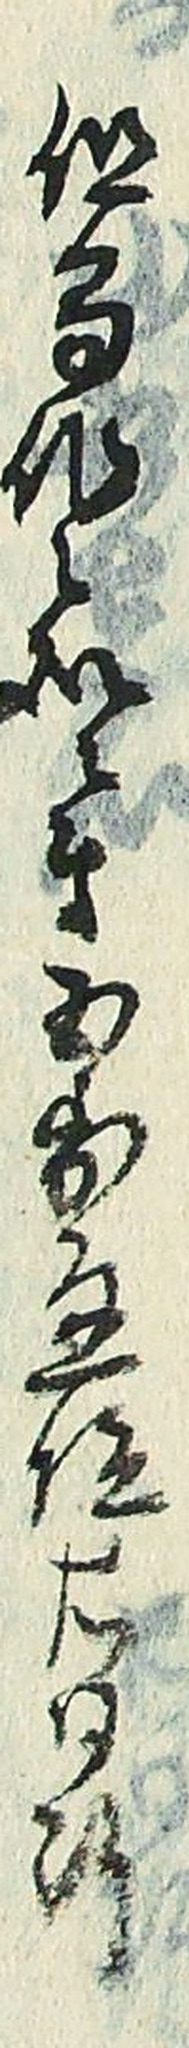但畠作之処ニ付五歩通位右同断

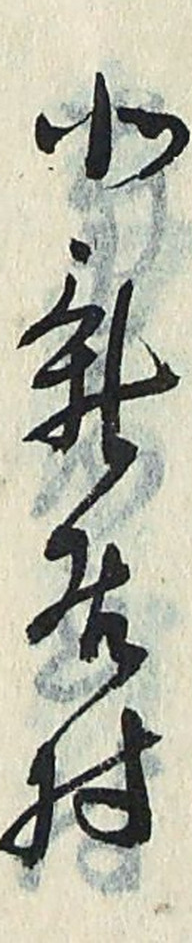北新居村
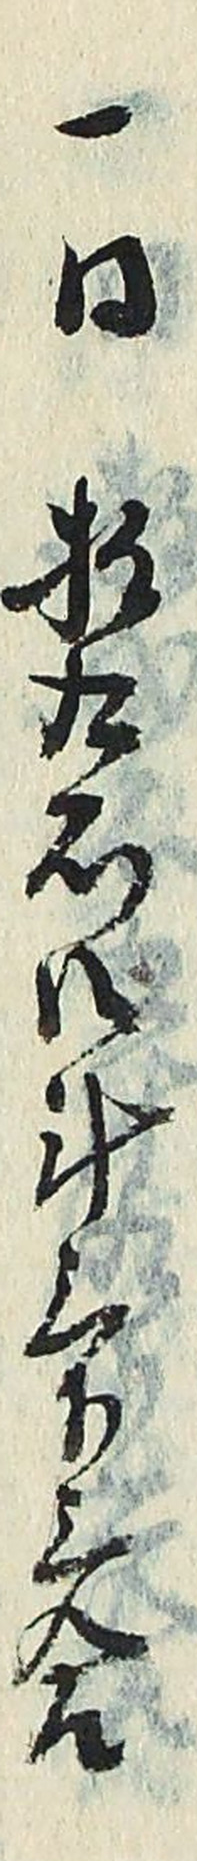一同拾九石八斗三升三合
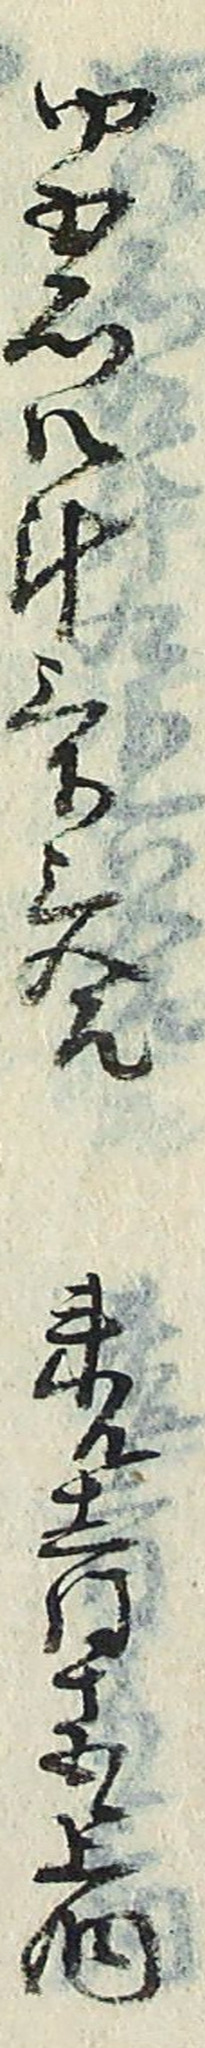内五石八斗三升三合来ル十二月十五日上納
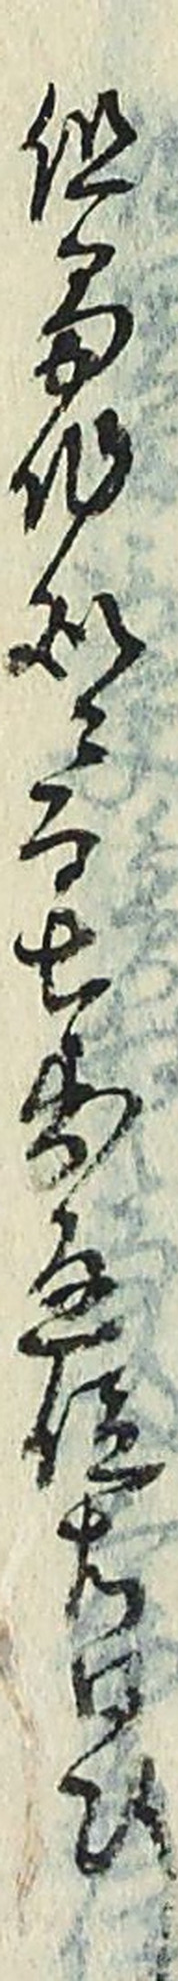但畠作処ニ而七歩通位右同断
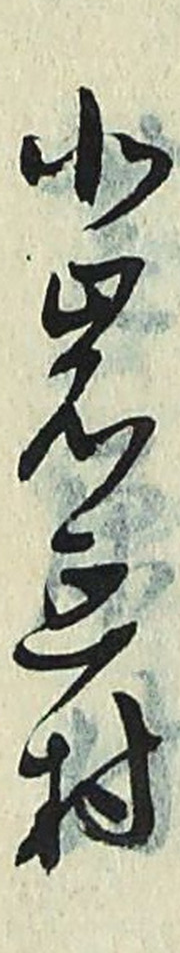北岩延村
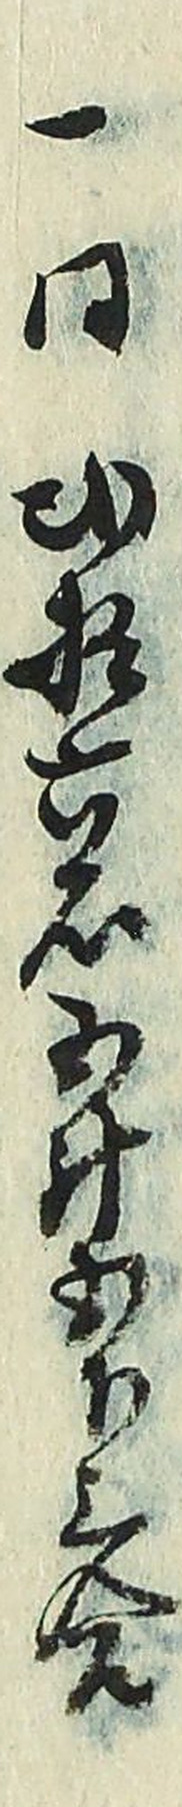一同弐拾六石五斗五升三合
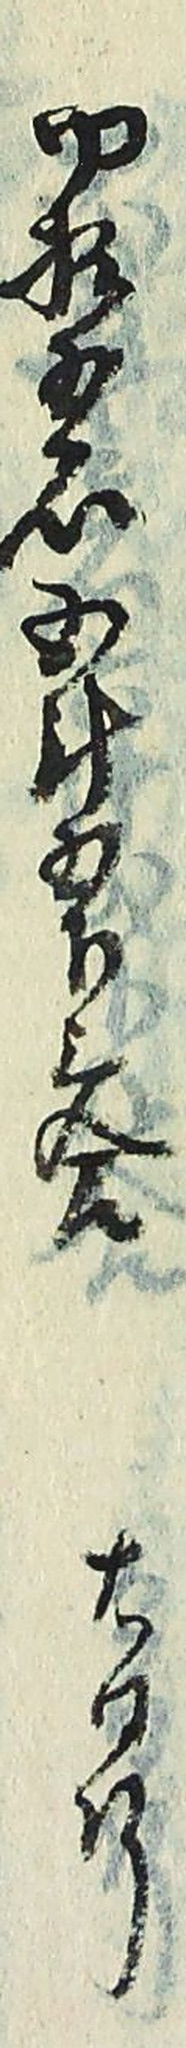内拾五石五斗五升三合右同断
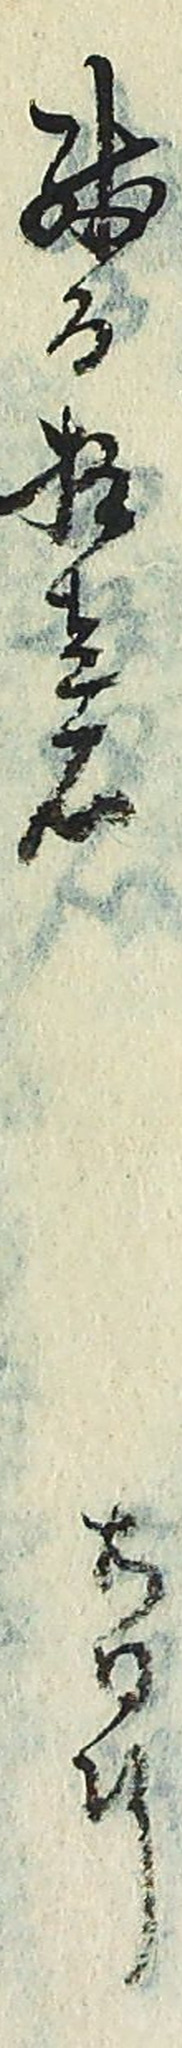残而拾壱石右同断
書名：諸御趣意書并御下知向之写
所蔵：鳴門教育大学 Naruto University of Education
